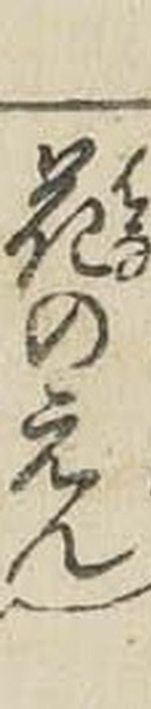花のえん
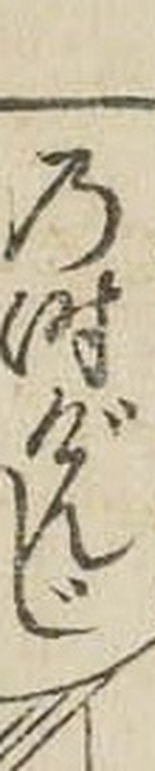の時げんじ
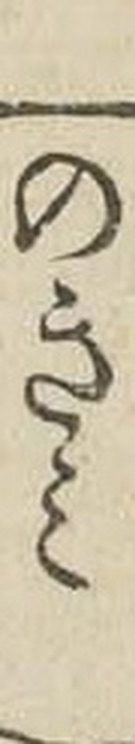のきみ
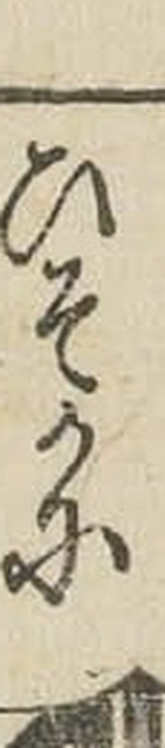ひそかに
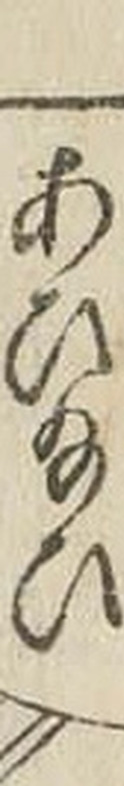あひ給ひ
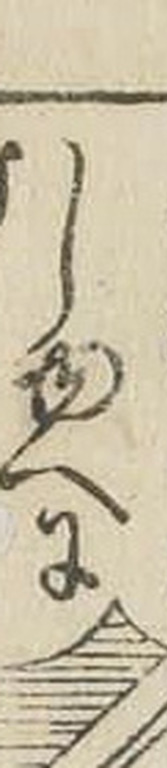しゆへに
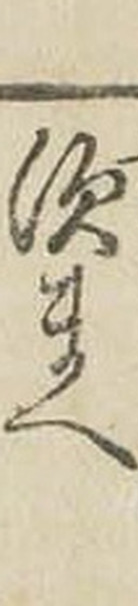須まへ
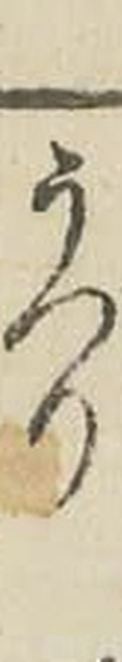うつり
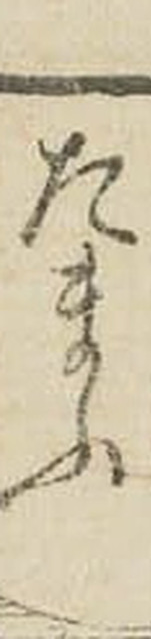たまふ
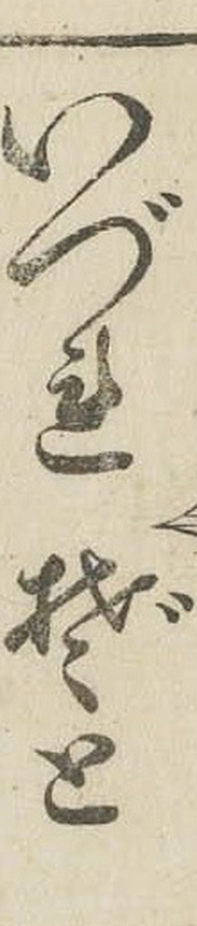いづれぞと
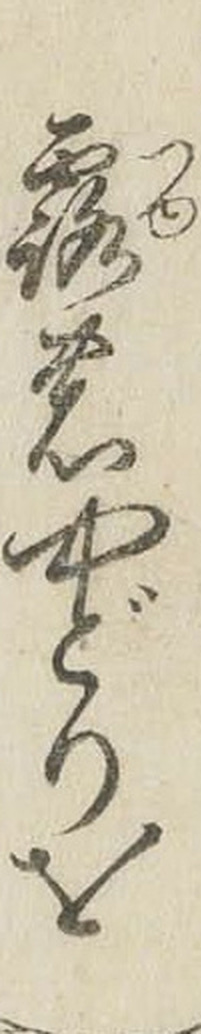露のやどりを
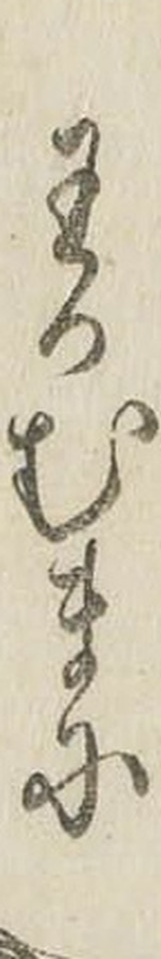わかむまに
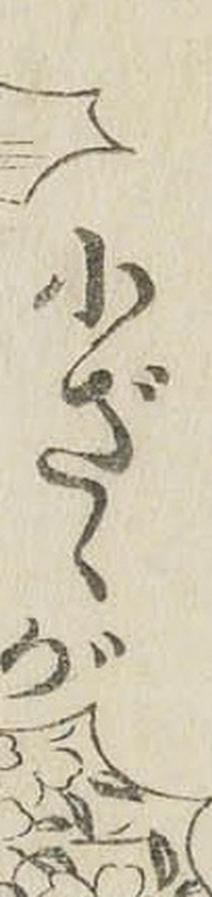小ざゝが
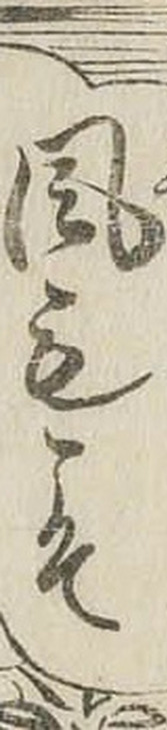風もこそ
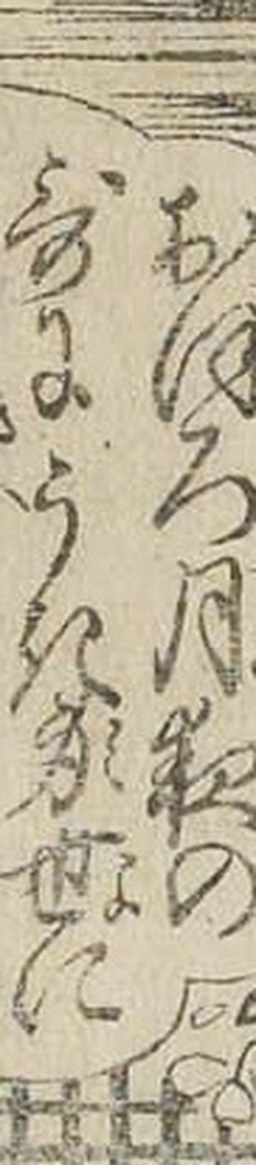哥にうき身世に
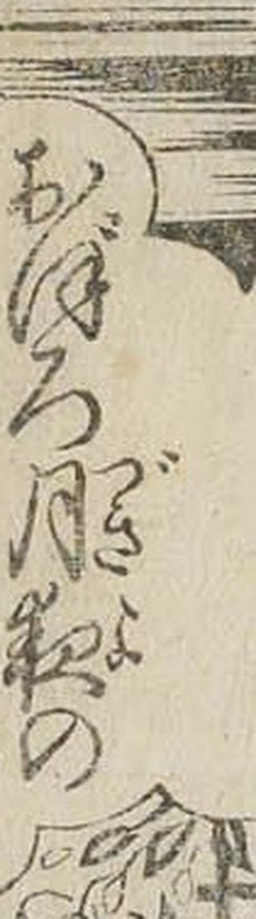おぼろ月夜の
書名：絵本写宝袋 9巻 1之巻
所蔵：東京学芸大学教育コンテンツアーカイブ
